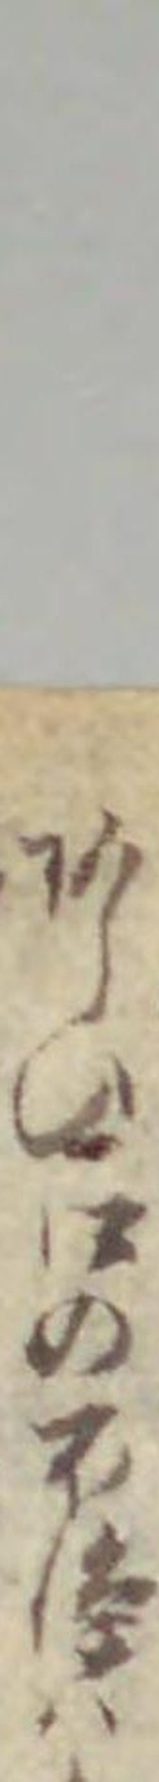あらひ口の不浄ハ
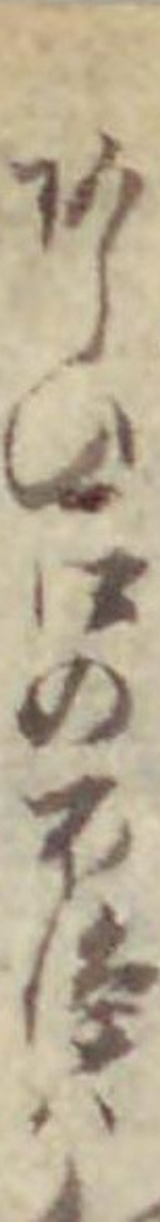あらひ口の不浄ハ
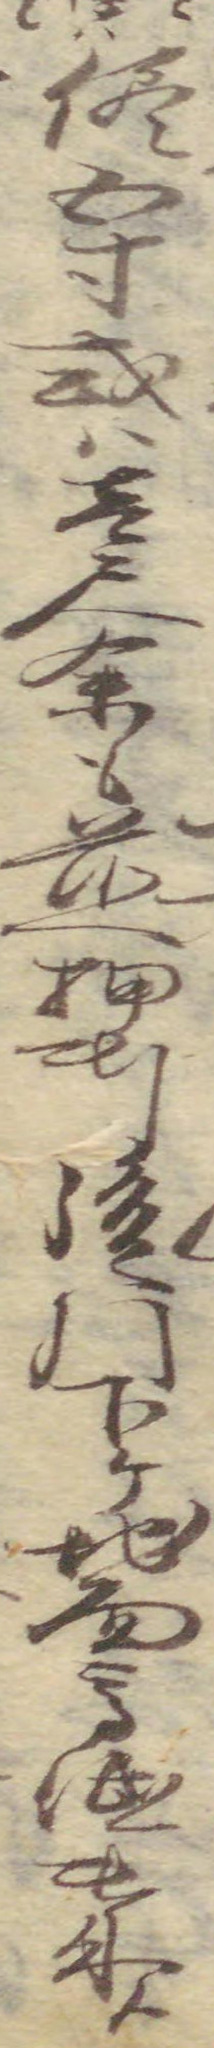儘五寸或ハ壱尺余も前へ押し出し後へ引下げ地面高低出来候
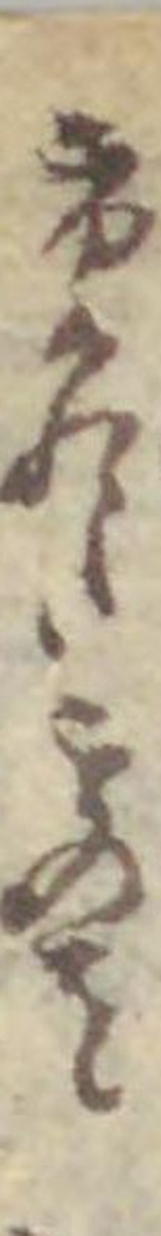けかれたものを
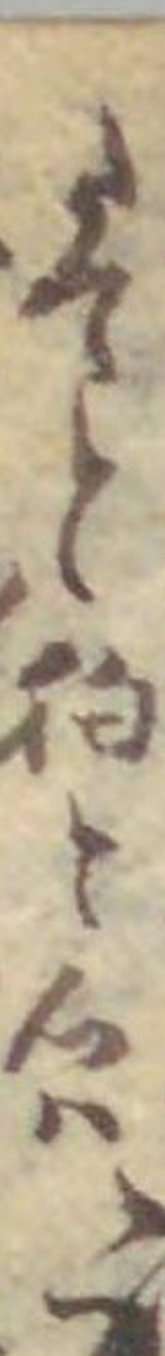たてと胸と心ハ
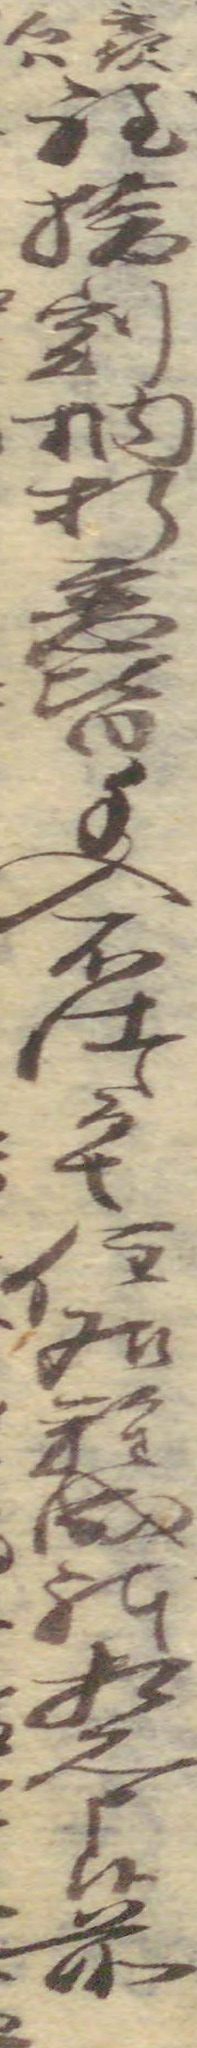程捻割枘折悉皆手入不仕候ては住居難成体相見申候前

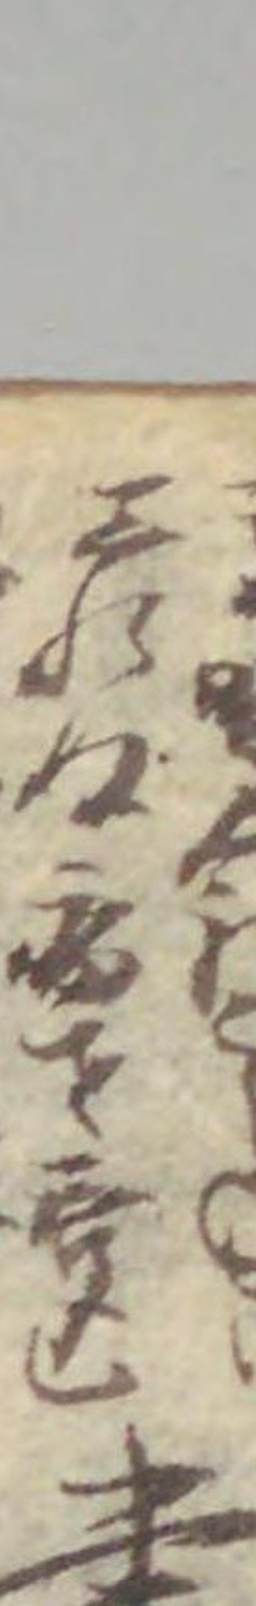しれぬ病を呑込
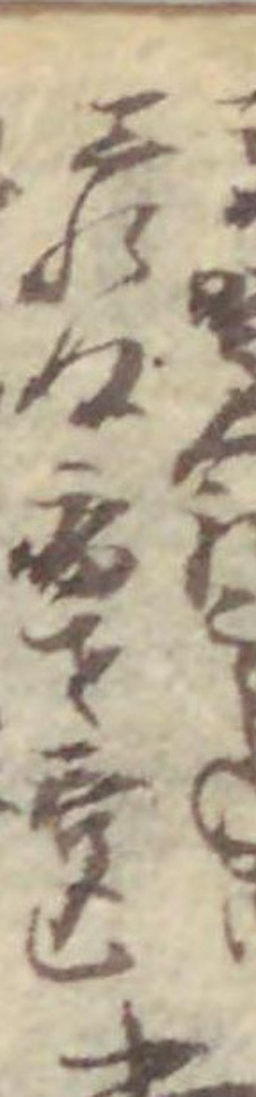しれぬ病を呑込
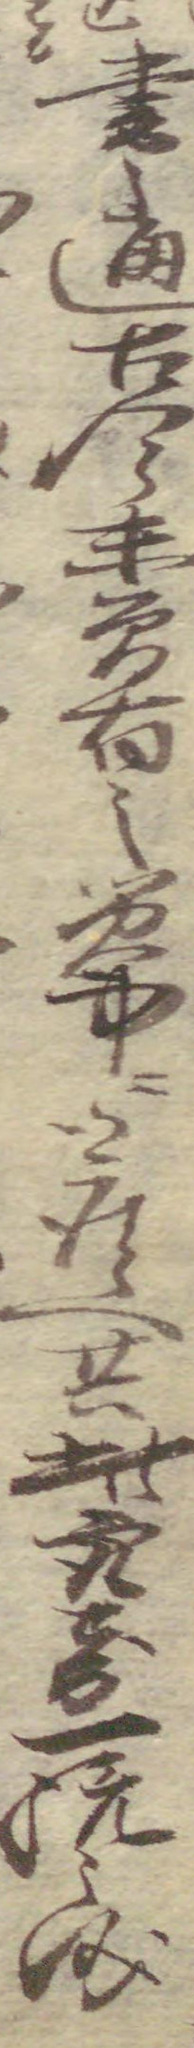書之通古今未曾有之災事ニ御座候へ共此最寄一統之儀
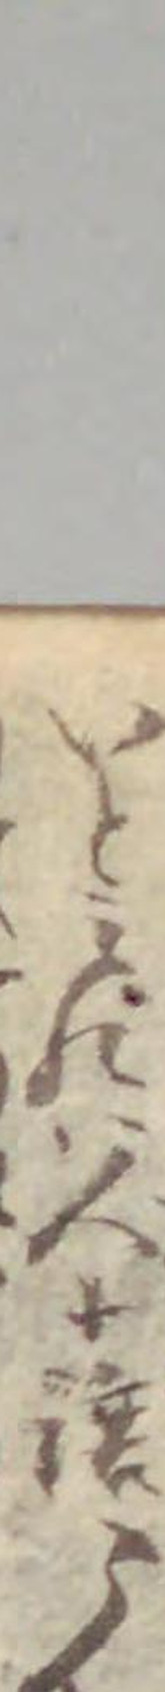いとミれハ人に譲
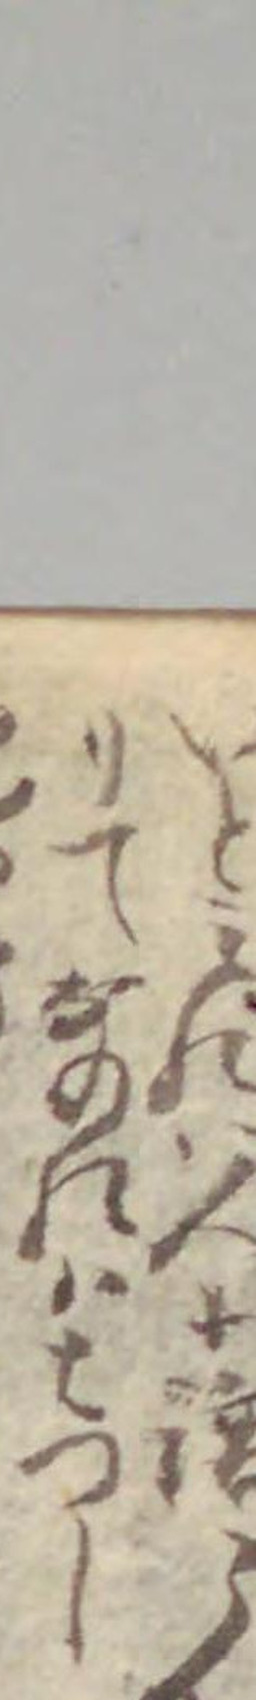りておのれハはつし
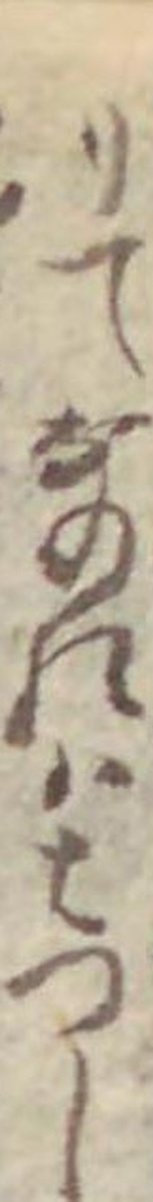りておのれハはつし
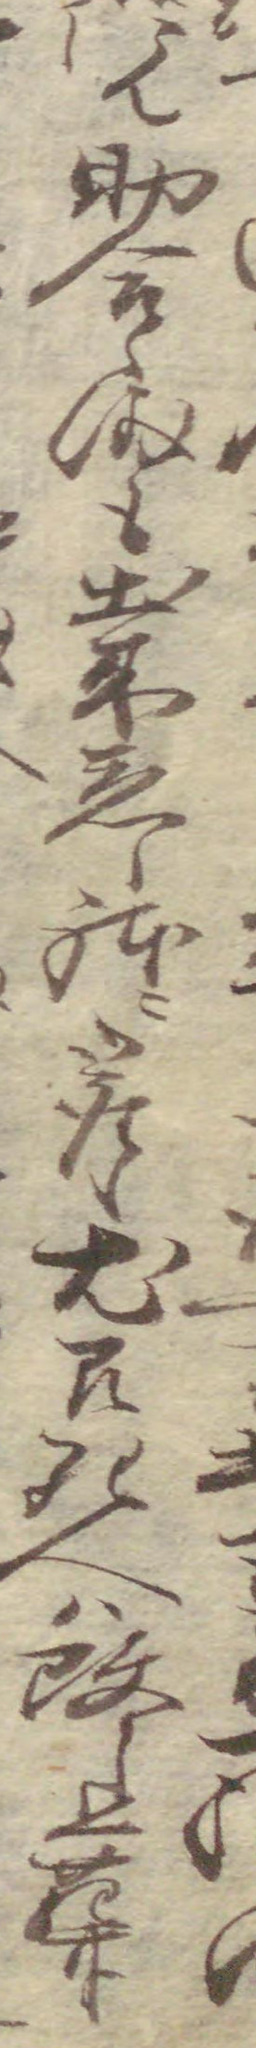ニて助合之儀も出来兼候体ニ御座候尤即死人ハ改之上葬
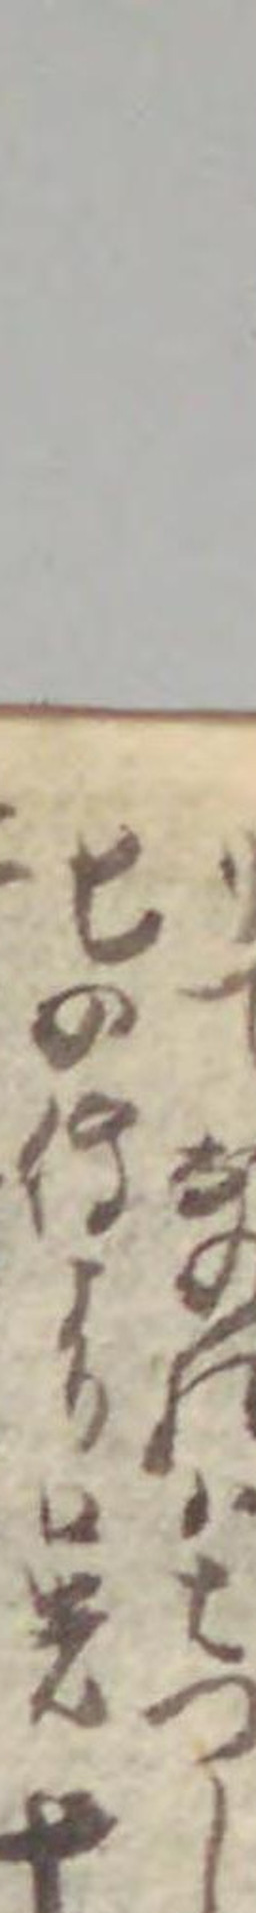匕の伝より口先
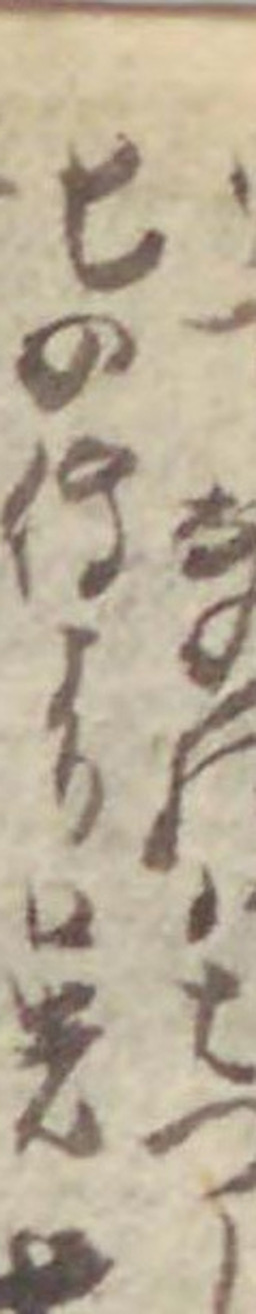匕の伝より口先
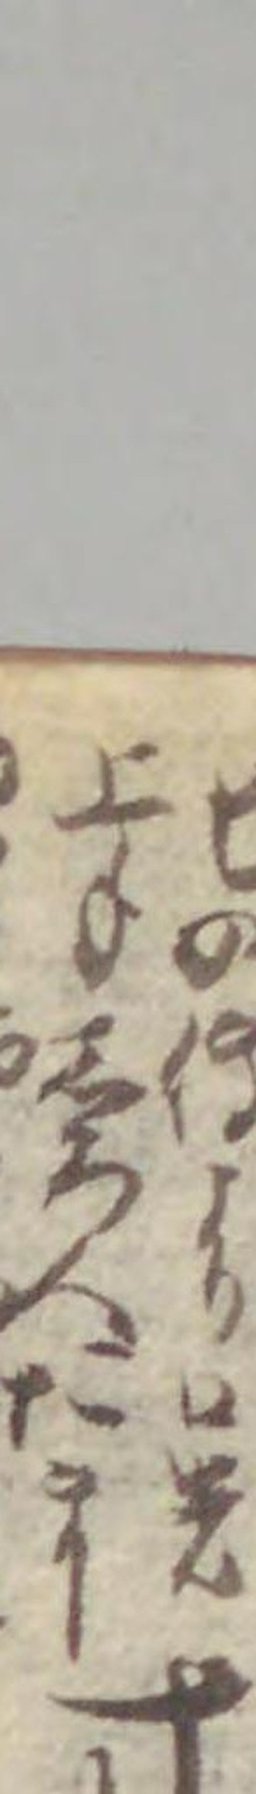上手しろ人たまし
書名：鶯宿雑記. 巻199-200
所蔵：国立国会図書館 National Diet Library, JAPAN
